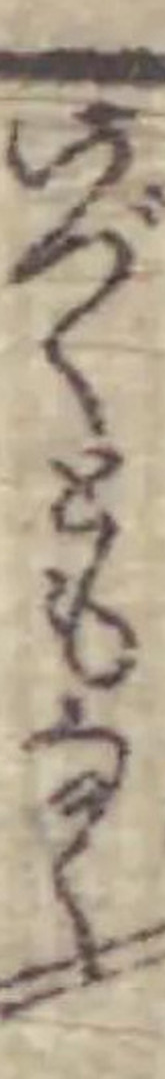いづくともなく
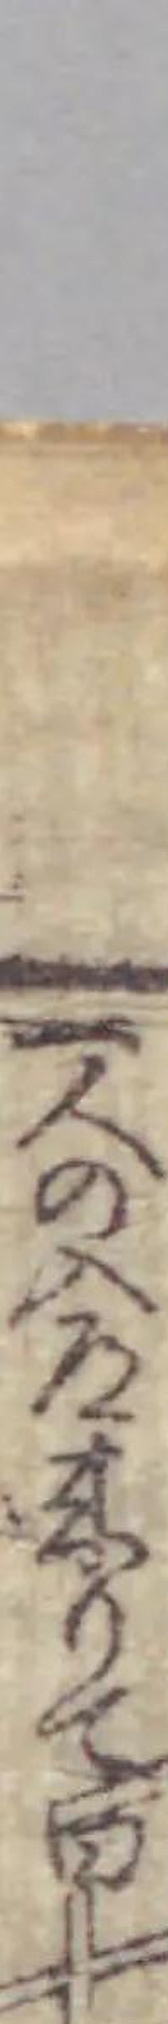一人の入道来りて曰
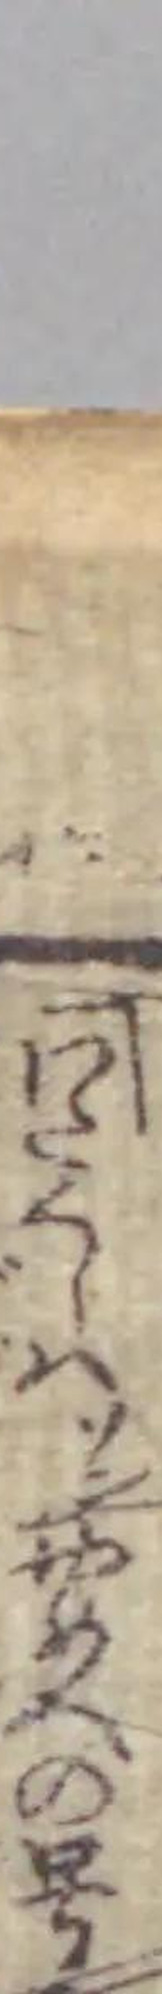〽わたくしはソンおめへの号に
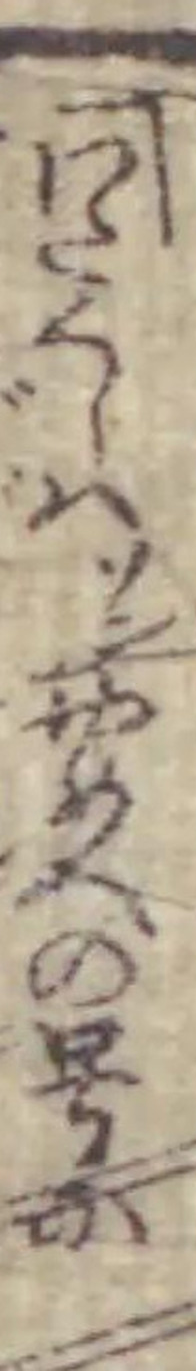〽わたくしはソンおめへの号に
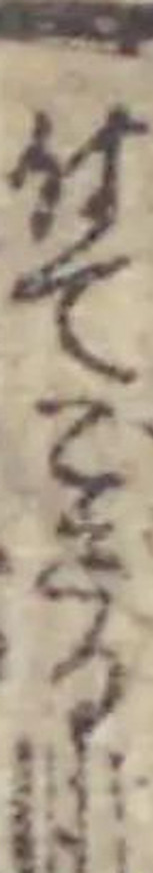付てござる
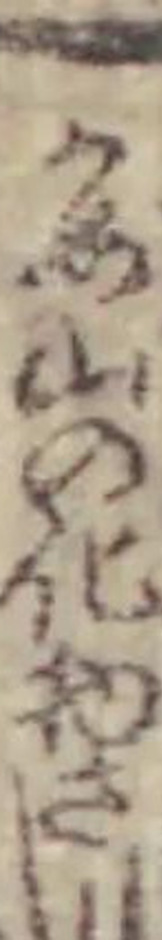かめ山の化物さ
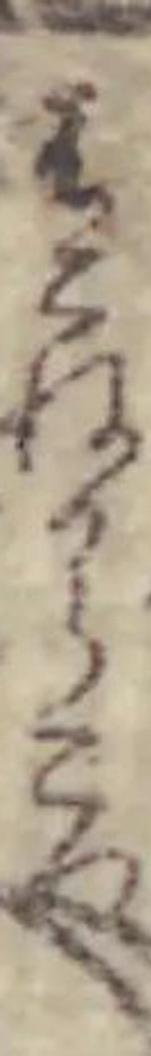はこねからこつ
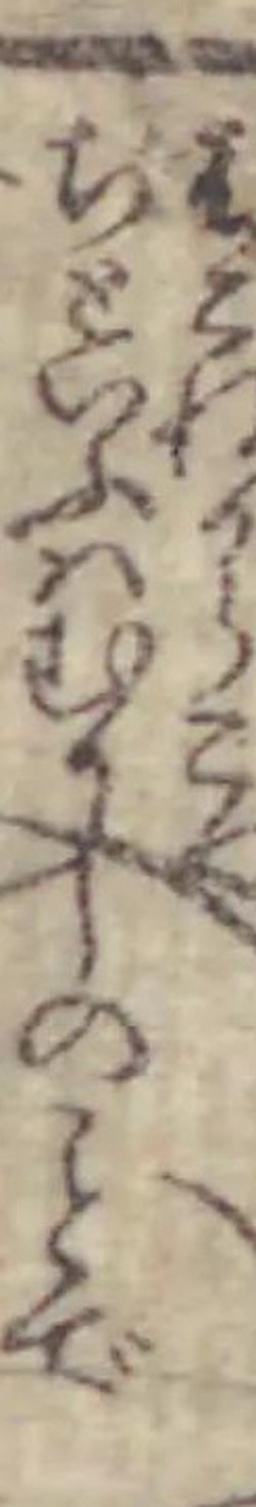ちといふはむかしのことで
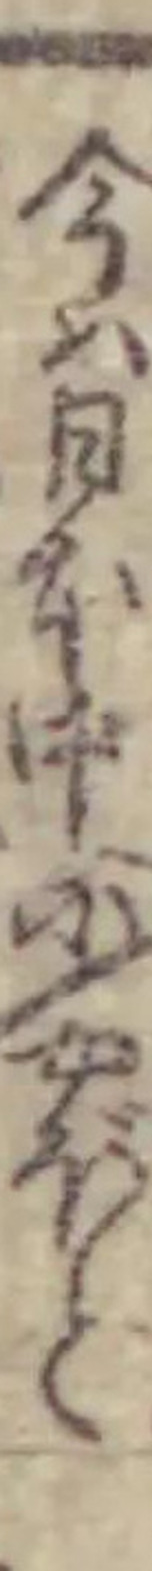今は日本中にやぼと
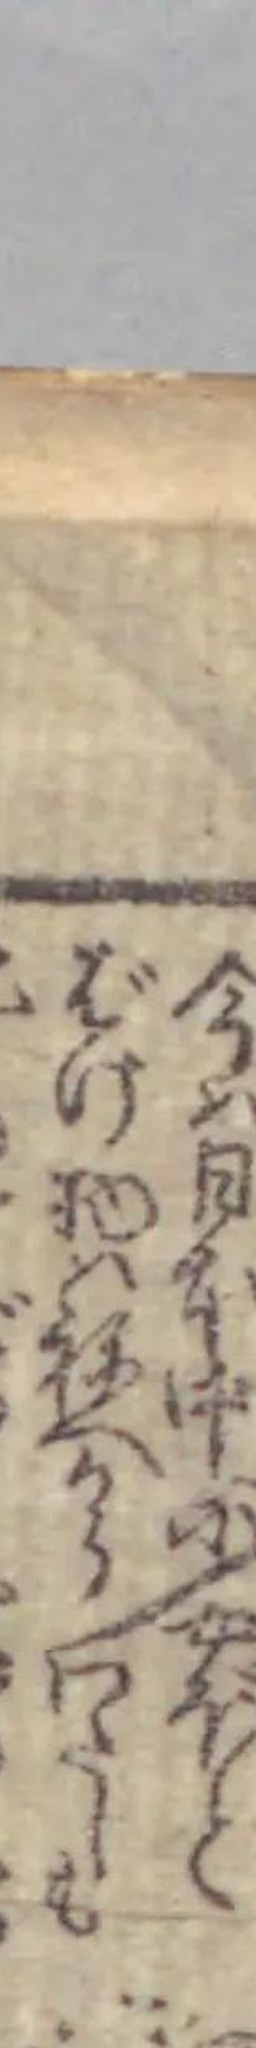ばけ物はねへからわたくしも
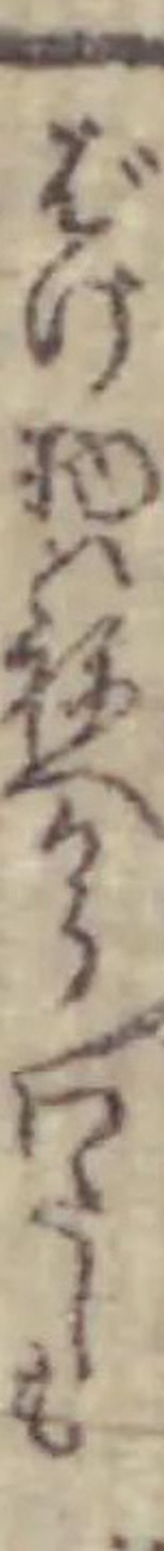ばけ物はねへからわたくしも
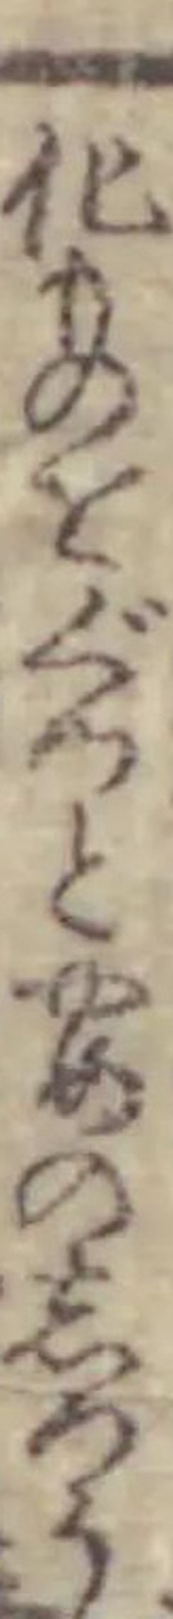化ものをくつとやめのしろう
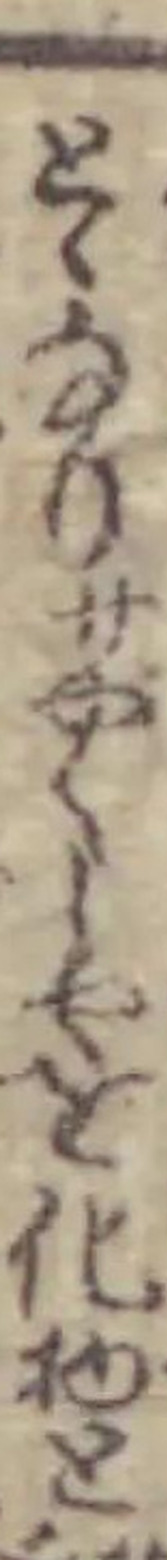とゝなりサやくしやを化物と
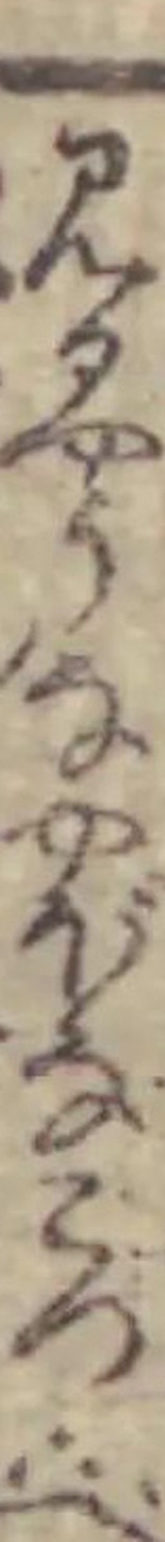見るやうなやぼなこつ
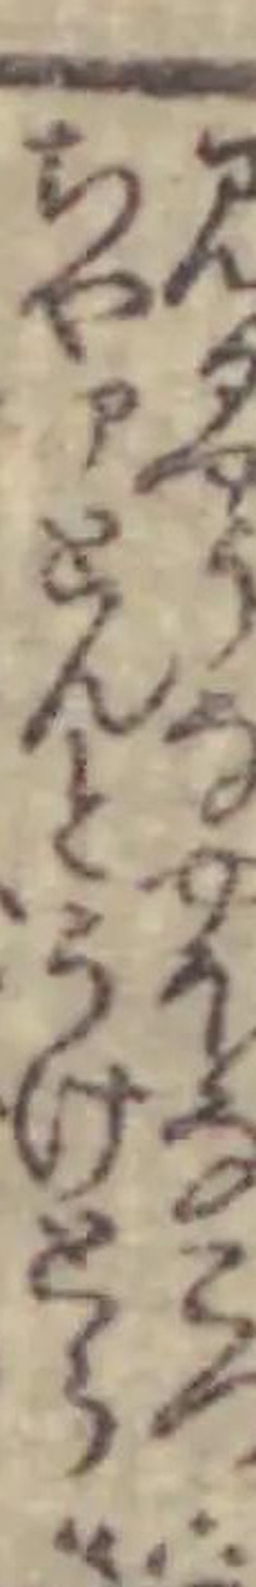ちやァとんとうけとら
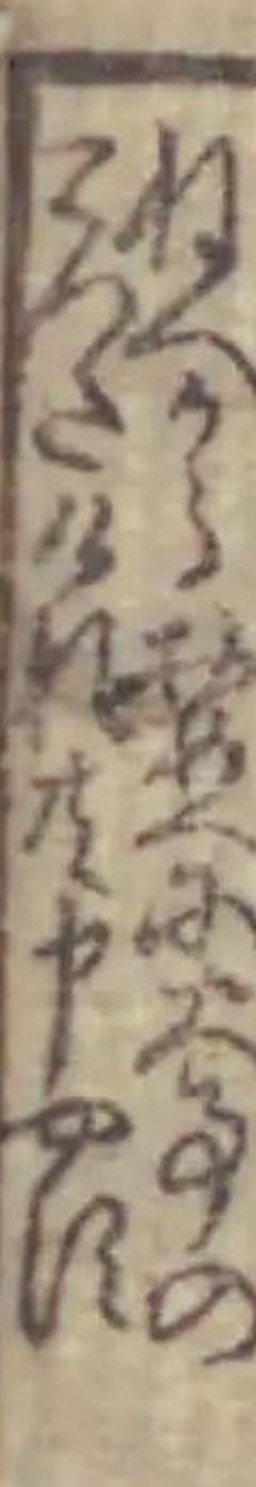こつたけれ共申やす
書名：亀山人家妖 3巻
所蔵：国立国会図書館 National Diet Library, JAPAN
